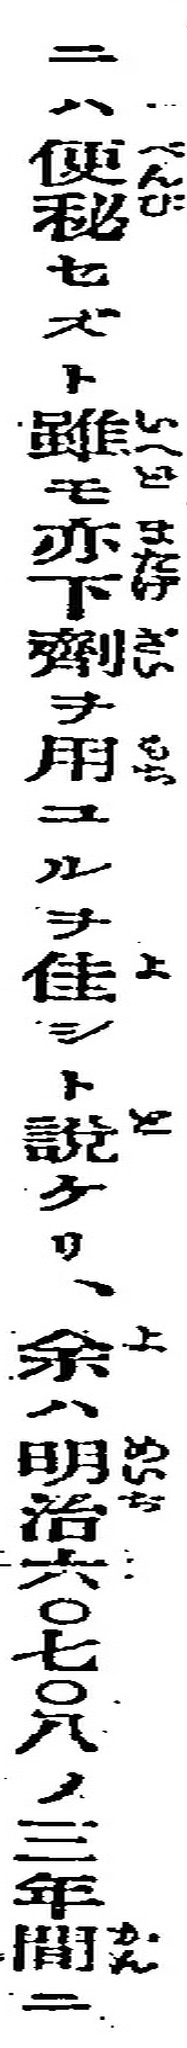ニハ便秘セズト雖モ亦下剤ヲ用ユルヲ佳シト説ケリ、余ハ明治六〇七〇八ノ三年間ニ
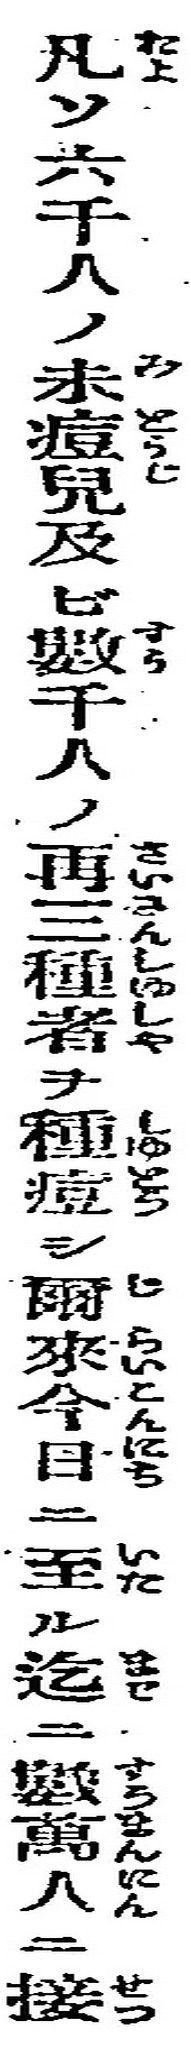凡ソ六千人ノ未痘児及ビ数千人ノ再三種者ヲ種痘シ爾来今日ニ至ル迄ニ数万人ニ接
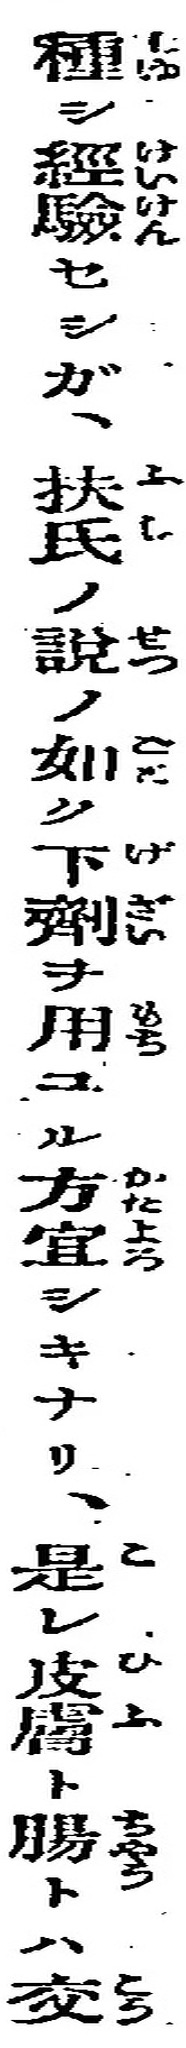種シ経験セシガ、扶氏ノ説ノ如ク下剤ヲ用ユル方宜シキナリ、是レ皮膚ト腸トハ交
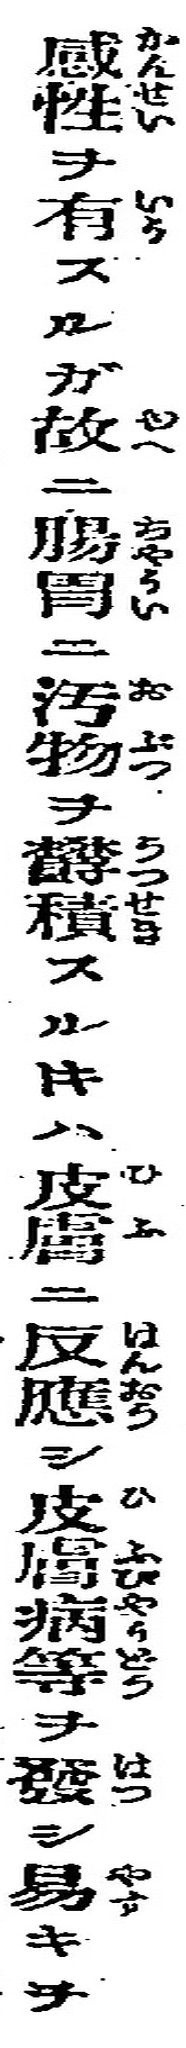感性ヲ有スルガ故ニ腸胃ニ汚物ヲ鬱積スルトキハ皮膚ニ反応シ皮膚病等ヲ発シ易キヲ
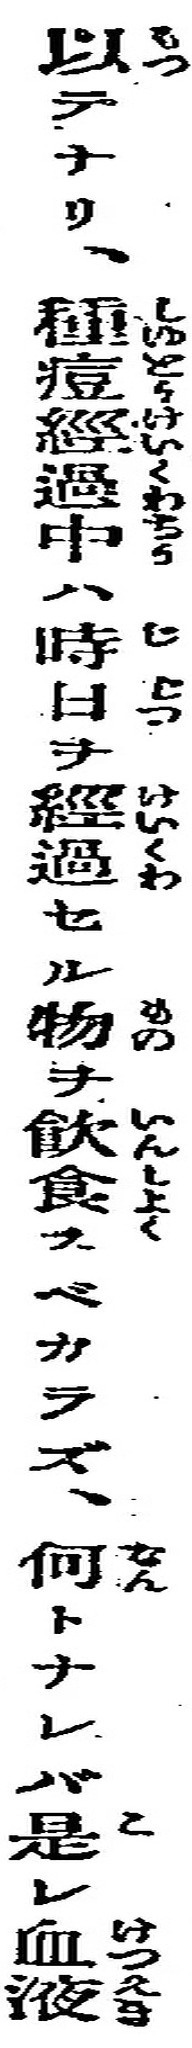以テナリ、種痘経過中ハ時日ヲ経過セル物ヲ飲食スベカラズ、何トナレバ是レ血液
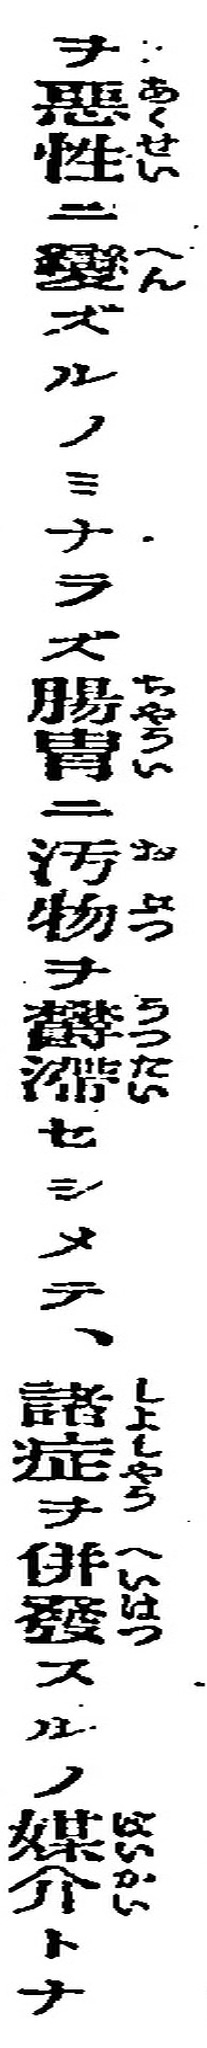ヲ悪性ニ変ズルノミナラズ腸胃ニ汚物ヲ鬱滞セシメテ、諸症ヲ併発スルノ媒介トナ
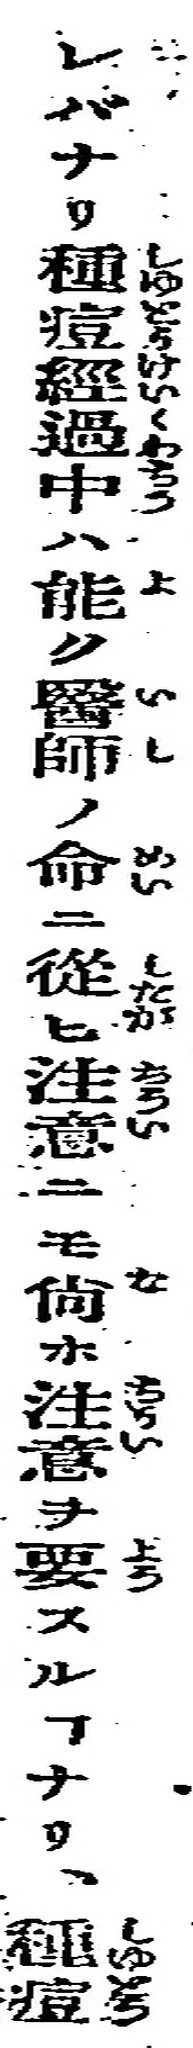レバナリ種痘経過中ハ能ク医師ノ命ニ従ヒ注意ニモ尚ホ注意ヲ要スルヿナリ、種痘
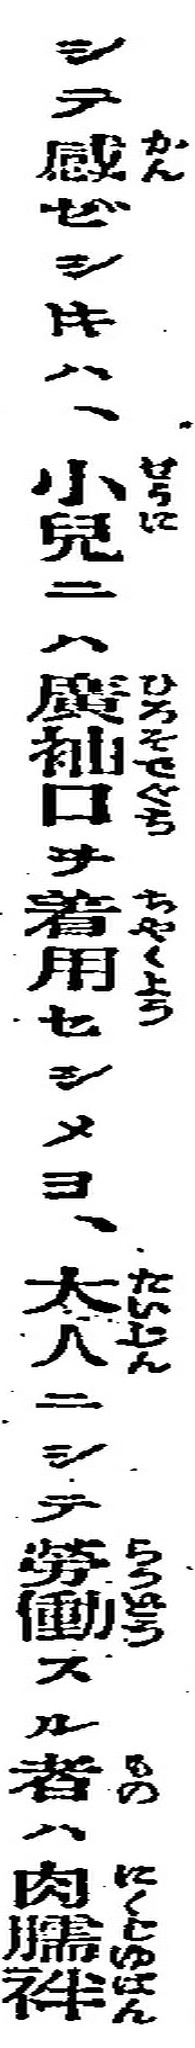シテ感ゼシトキハ、小児ニハ広袖口ヲ着用セシメヨ、大人ニシテ労働スル者ハ肉襦袢
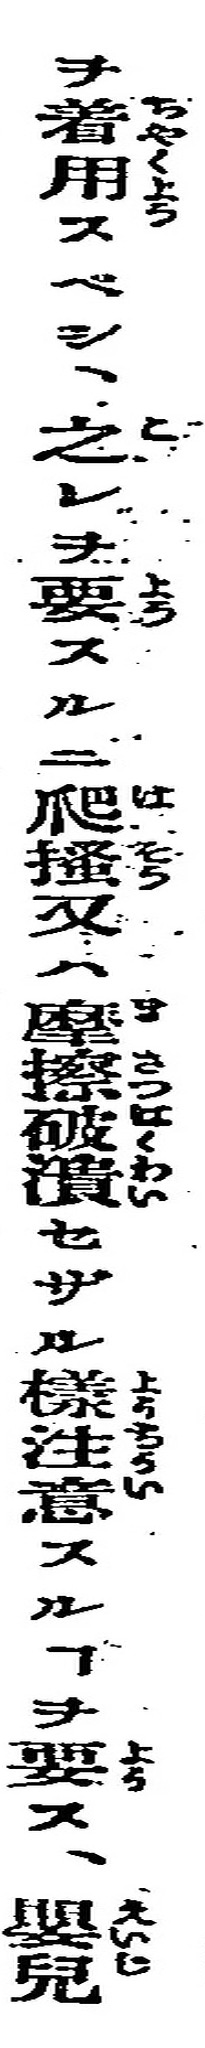ヲ着用スベシ、之レヲ要スルニ爬掻又ハ摩擦破潰セザル様注意スルヿヲ要ス、嬰児
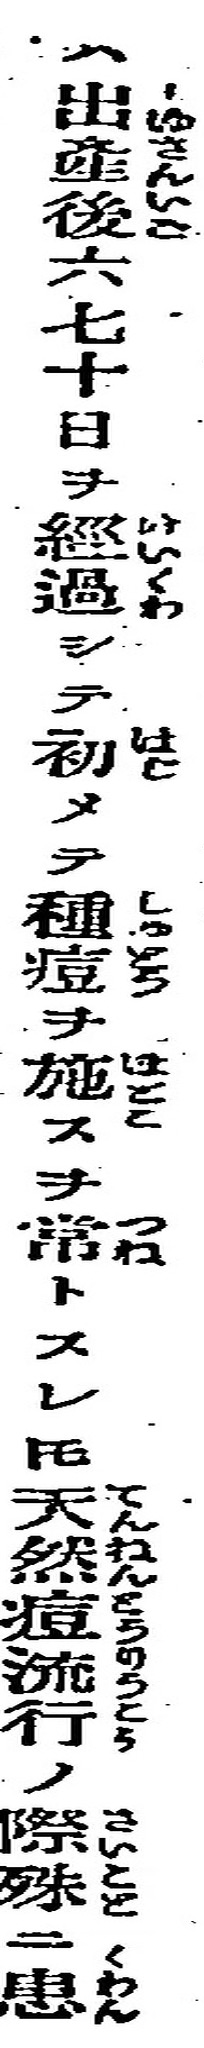ハ出産後六七十日ヲ経過シテ初メテ種痘ヲ施スヲ常トスレ𪜈天然痘流行ノ際殊ニ患
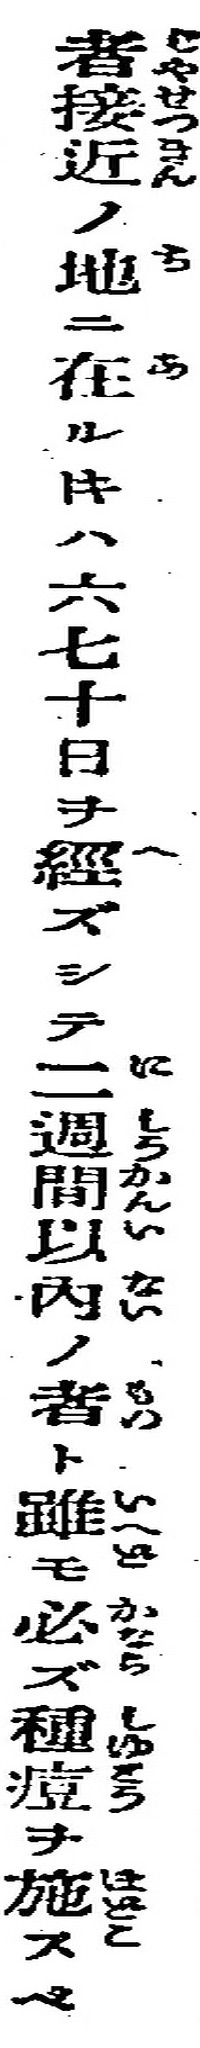者接近ノ地ニ在ルトキハ六七十日ヲ経ズシテ二週間以内ノ者ト雖モ必ズ種痘ヲ施スベ
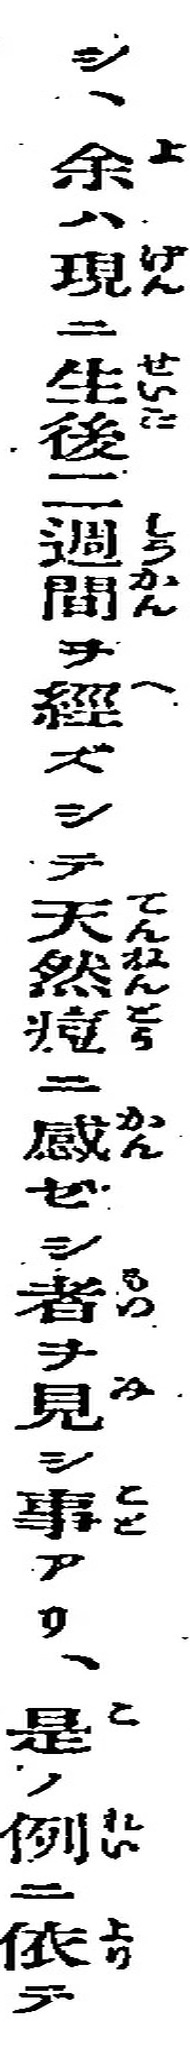シ、余ハ現ニ生後二週間ヲ経ズシテ天然痘ヲ感ゼシ者ヲ見シ事アリ、是ノ例ニ依テ
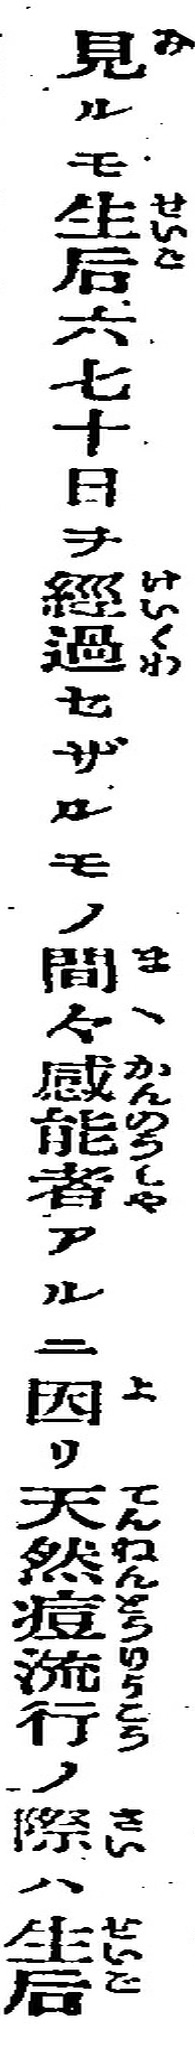見ルモ生后六七十日ヲ経過セザルモノ間々感能者アルニ因リ天然痘流行ノ際ハ生后
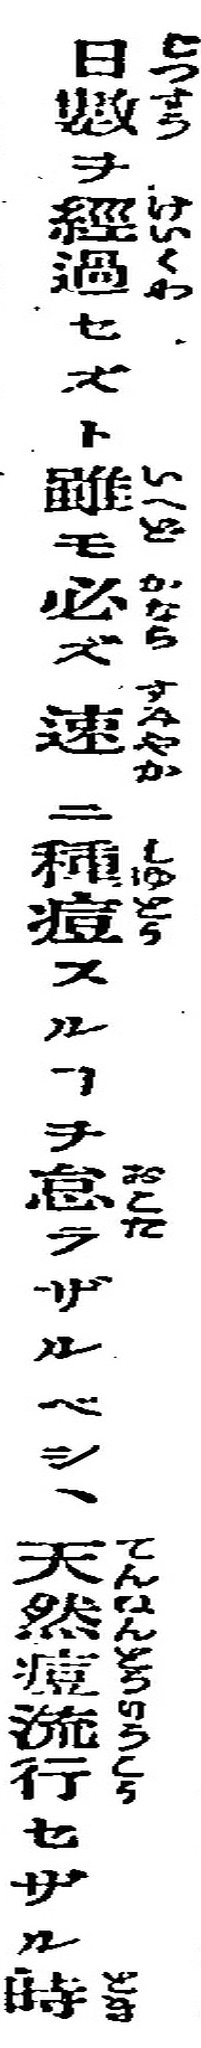日数ヲ経過セズト雖モ必ズ速ニ種痘スルヿヲ怠ラザルベシ、天然痘流行セザル時
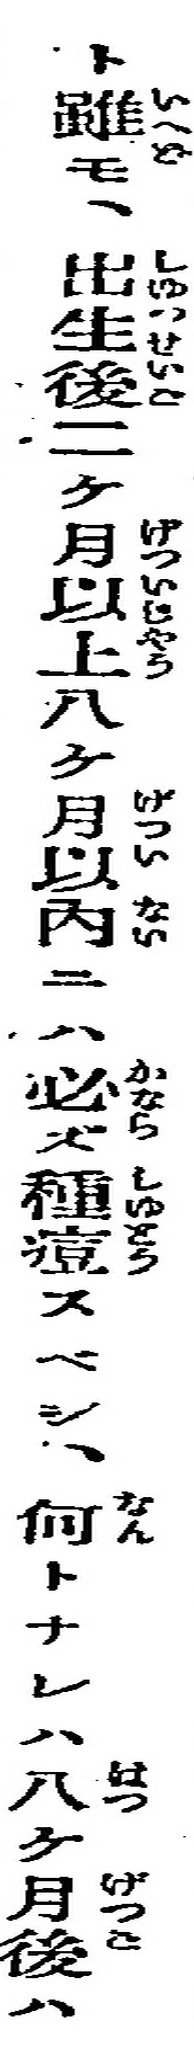ト雖モ、出生後二ヶ月以上八ヶ月以内ニハ必ズ種痘スベシ、何トナレハ八ヶ月後ハ
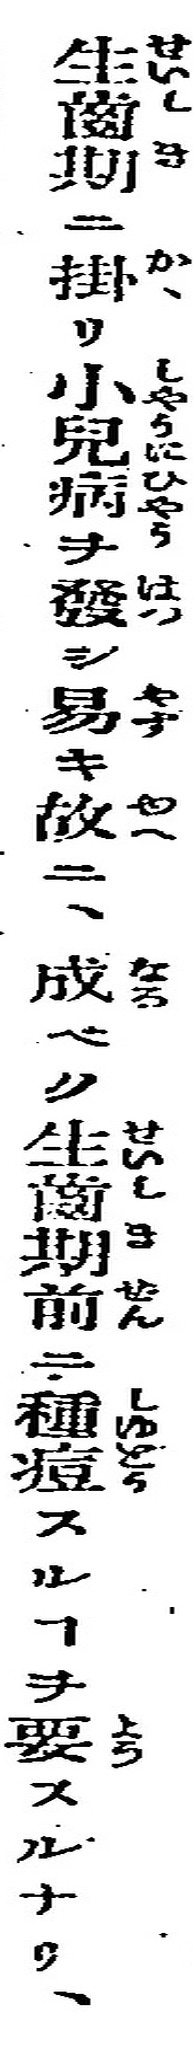生歯期ニ掛リ小児病ヲ発シ易キ故ニ、成ベク生歯期前ニ種痘スルヿヲ要スルナリ、
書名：天然痘予防注意兼種痘者之注意
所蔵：国立国会図書館 National Diet Library, JAPAN
